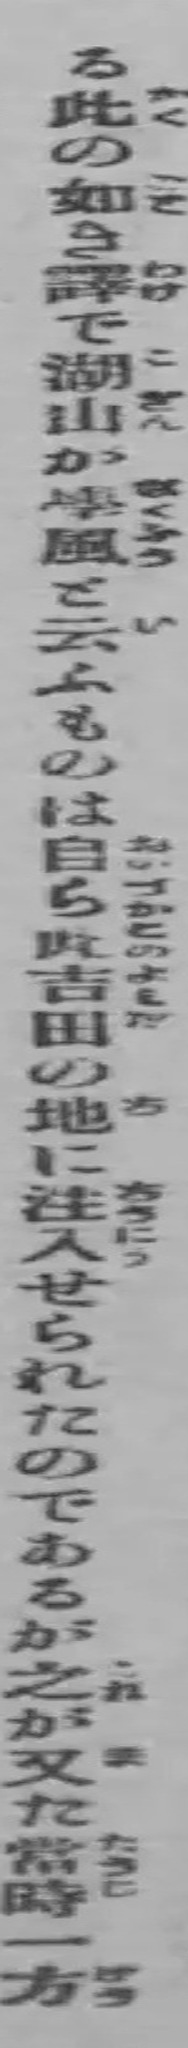る此の如き訳で湖山が学風と云ふものは自ら此吉田の地に注入せられたのであるが之が又た当時一方
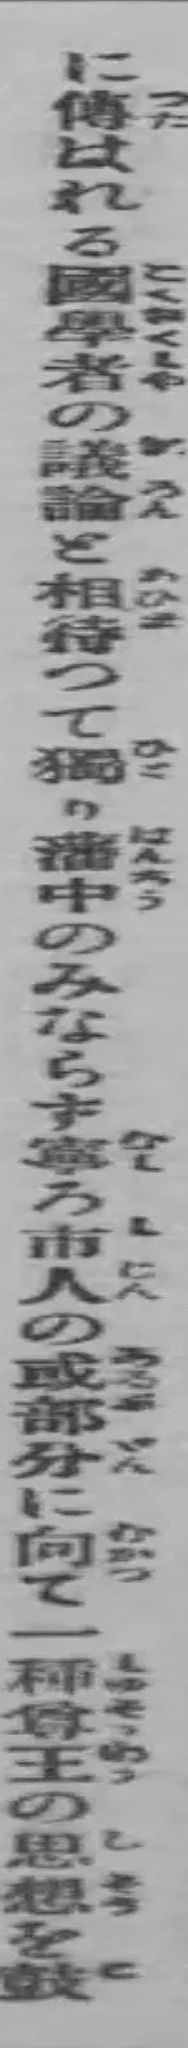に伝はれる国学者の議論と相待つて独り藩中のみならず寧ろ市人の或部分に向て一種尊王の思想を鼓
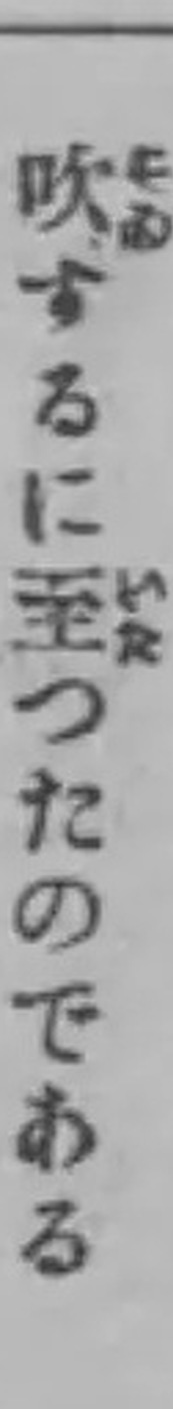吹するに至つたのである
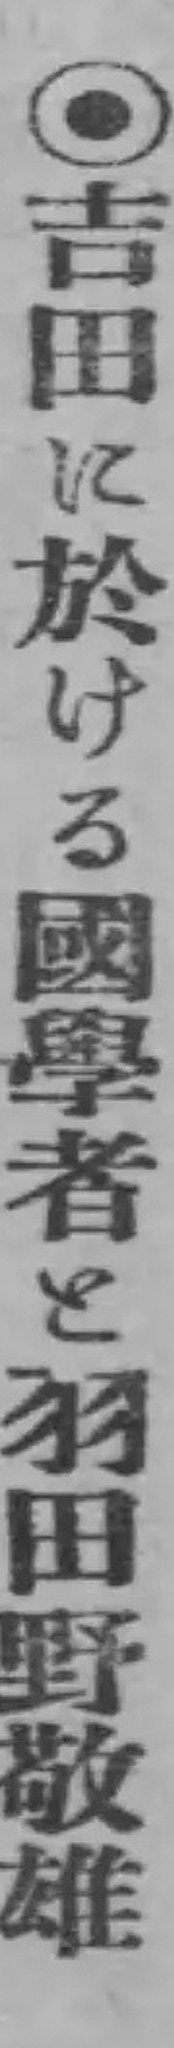⦿吉田に於ける国学者と羽田野敬雄
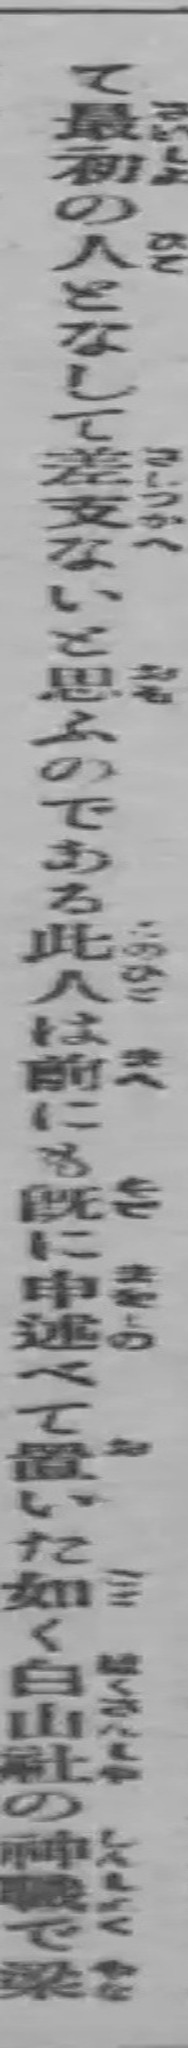て最初の人となして差支ないと思ふのである此人は前にも既に申述べて置いた如く白山社の神職で梁
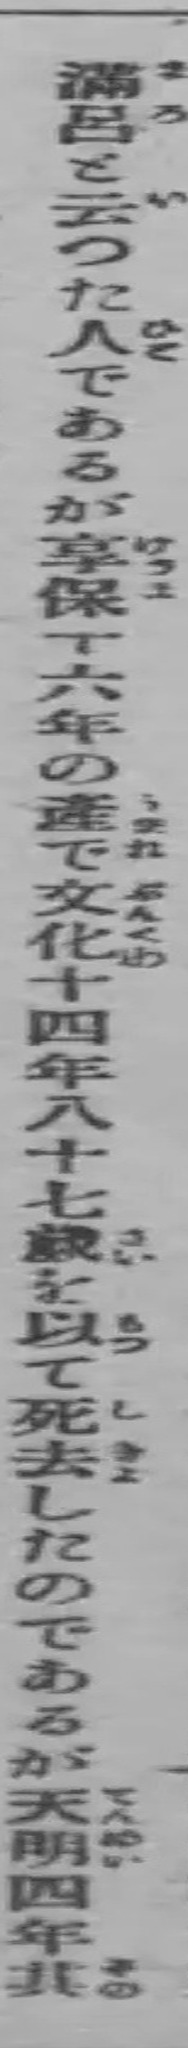満呂と云つた人であるが享保十六年の産で文化十四年八十七歳を以て死去したのであるが天明四年其
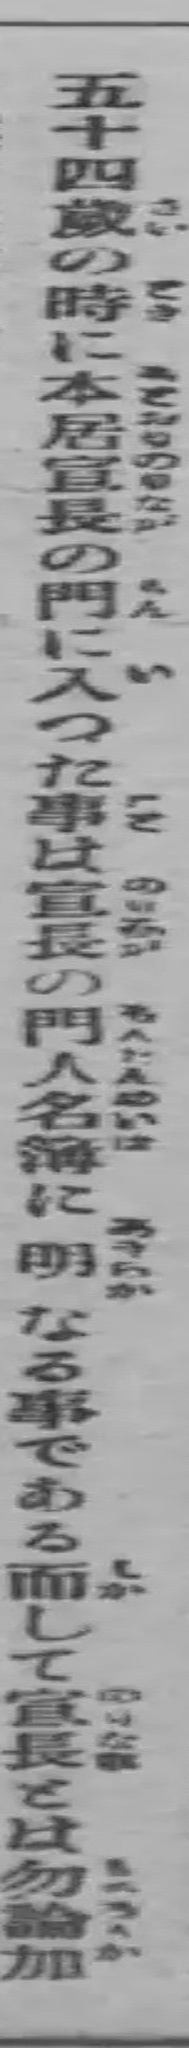五十四歳の時に本居宣長の門に入つた事は宣長の門人名簿に明なる事である而して宣長とは勿論加
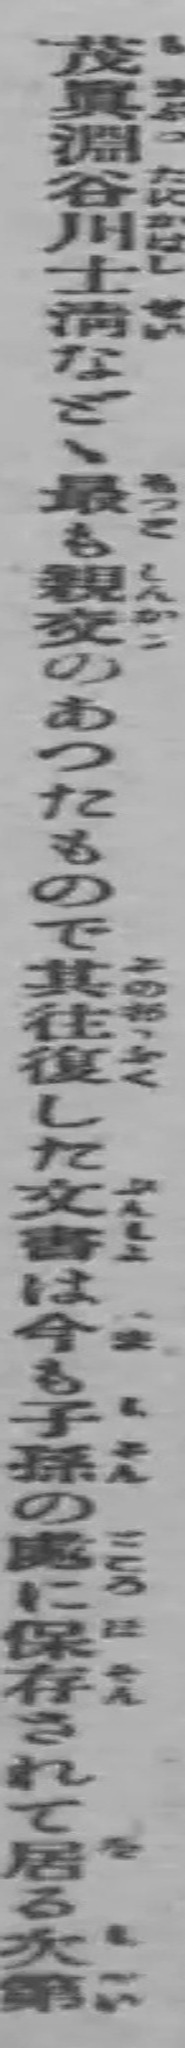茂真淵谷川士清などゝ最も親交のあつたもので其往復した文書は今も子孫の処に保存されて居る次第
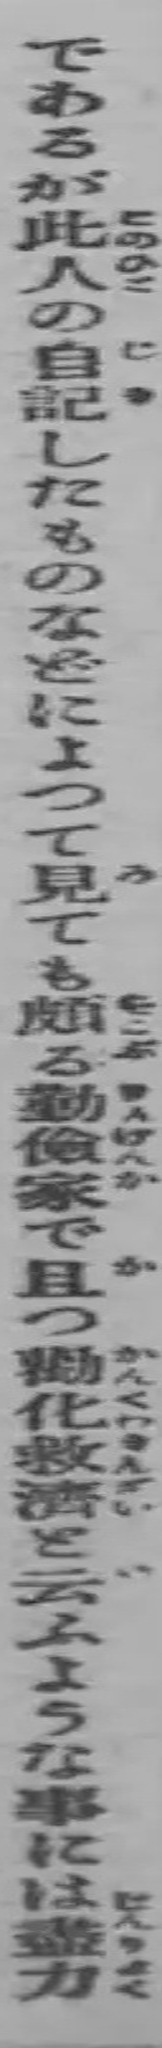であるが此人の自記したものなどによつて見ても頗る勤倹家で且つ勧化救済と云ふような事には尽力
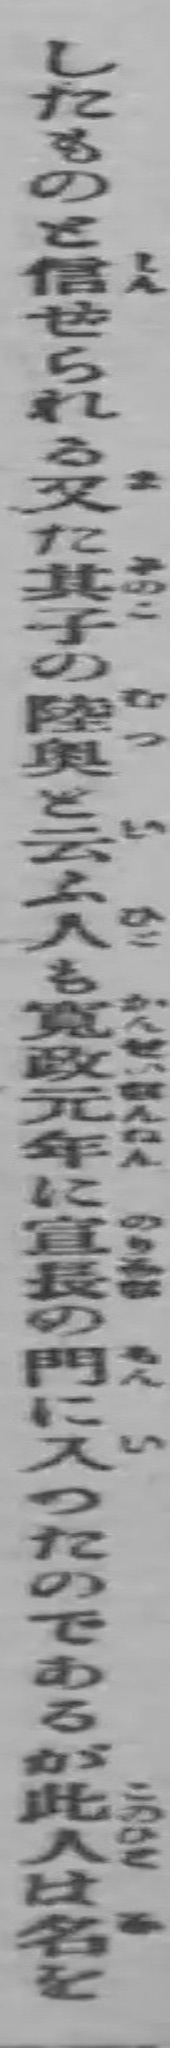したものと信ぜられる又た其子の陸奥と云ふ人も寛政元年に宣長の門に入つたのであるが此人は名を
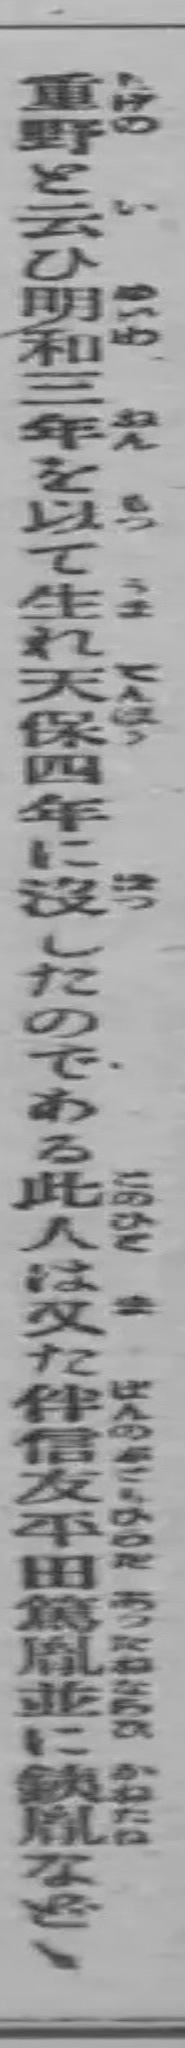重野と云ひ明和三年を以て生れ天保四年に没したのである此人は又た伴信友平田篤胤並に鐵胤などゝ
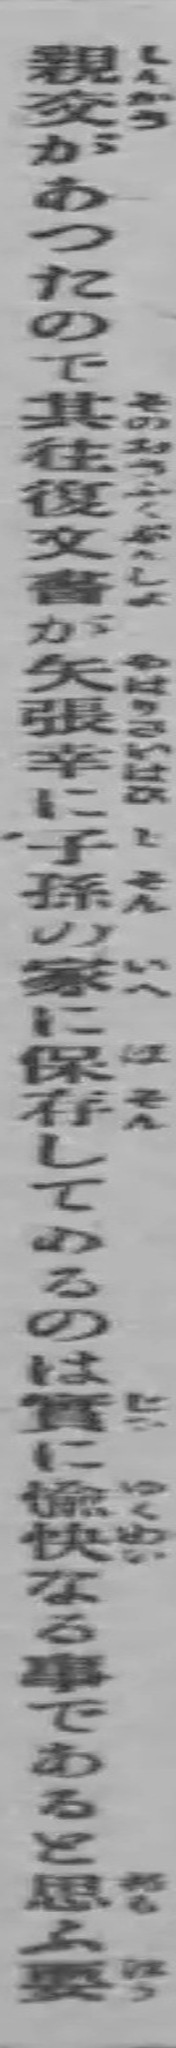親交があつたので其往復文書が矢張幸に子孫の家に保存してあるのは実に愉快なる事である思ふ要
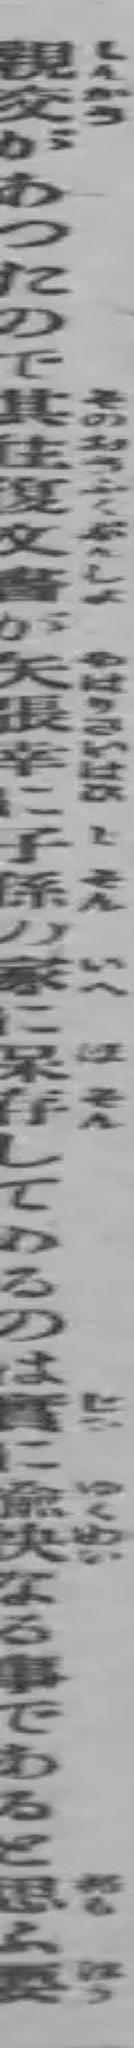親交があつたので其往復文書が矢張幸に子孫の家に保存してあるのは実に愉快なる事である思ふ要
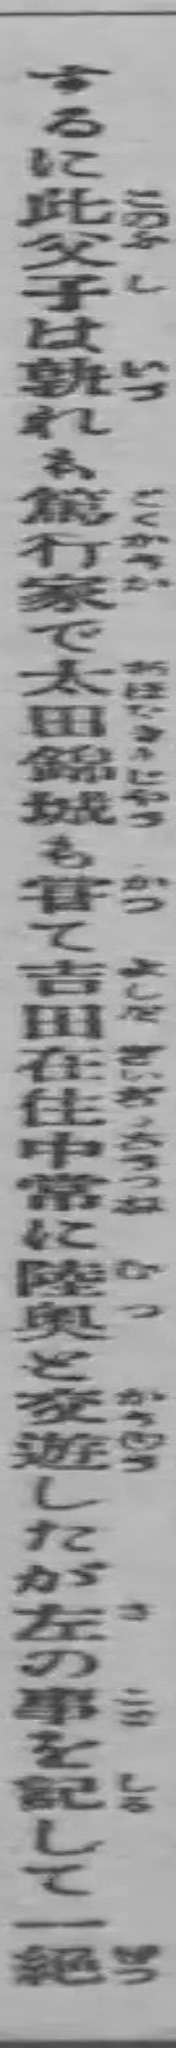するに此父子は孰れも篤行家で太田錦城も嘗て吉田在住中常に陸奥と交遊したが左の事を記して一絶
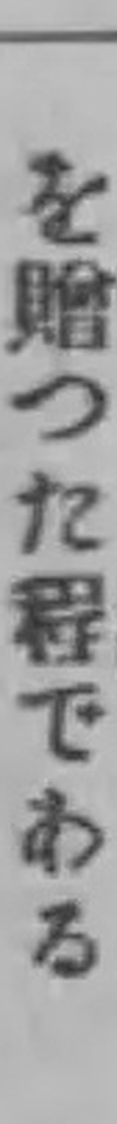を贈つた程である
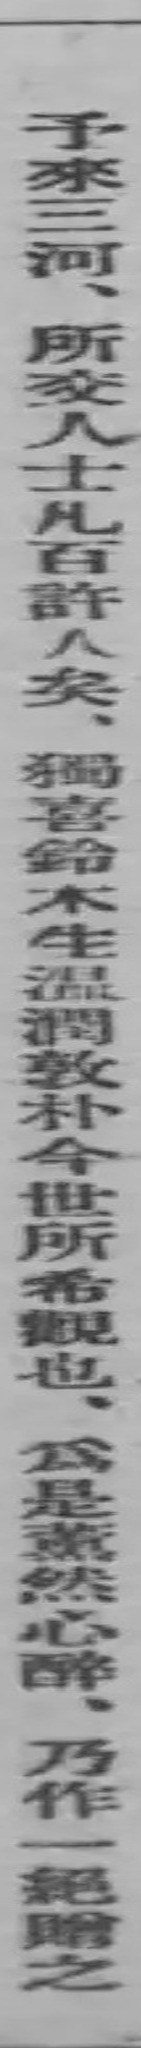予来三河、所交人士凡百許人矣、独喜鈴木生温潤敦朴今世所希観也、為是薫然心酔、乃作一絶贈之
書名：豊橋市史談
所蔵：国立国会図書館 National Diet Library, JAPAN
